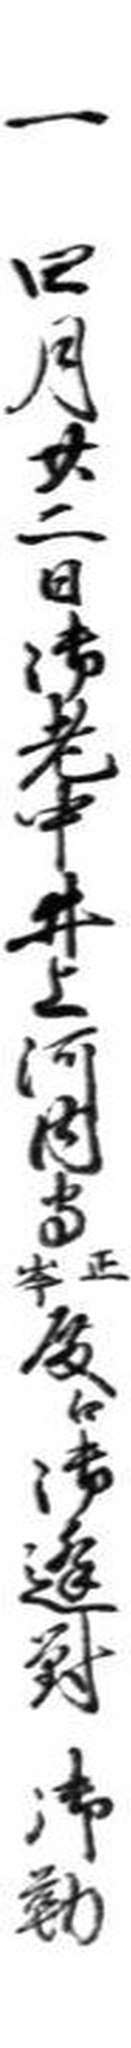一四月廿二日御老中井上河内守正岑殿江
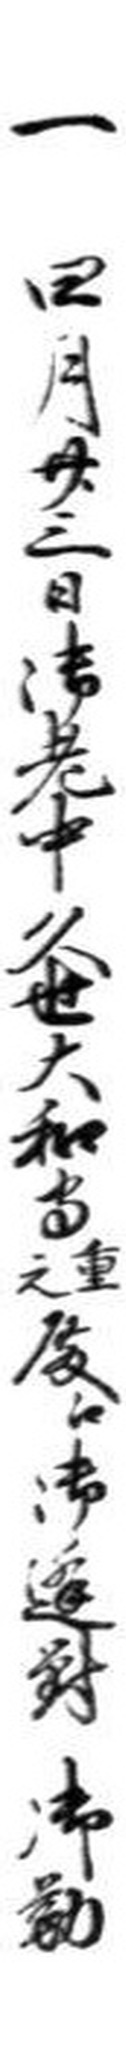一四月廿三日御老中久世大和守重之殿江御逢対御勤
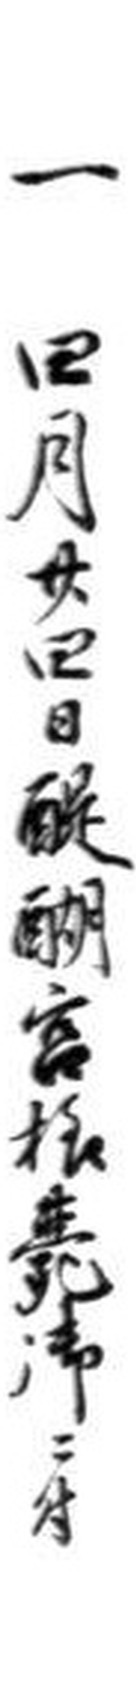一四月廿四日醍醐宮様薨御ニ付
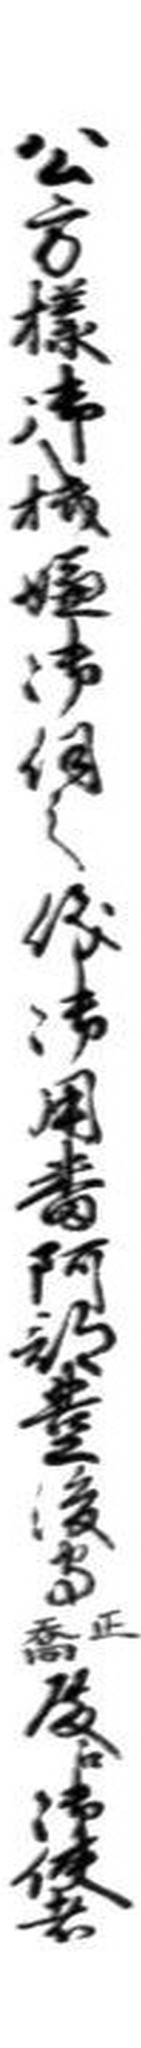公方様御機嫌御伺之儀御用番阿部豊後守正喬殿江御使者
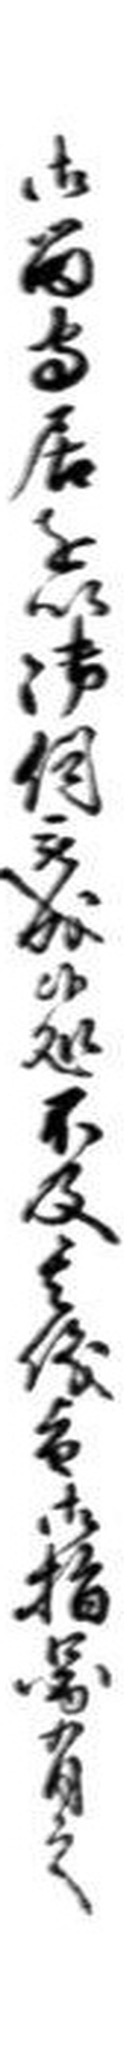御留守居を以御伺被成候処不及其儀旨御指図有之
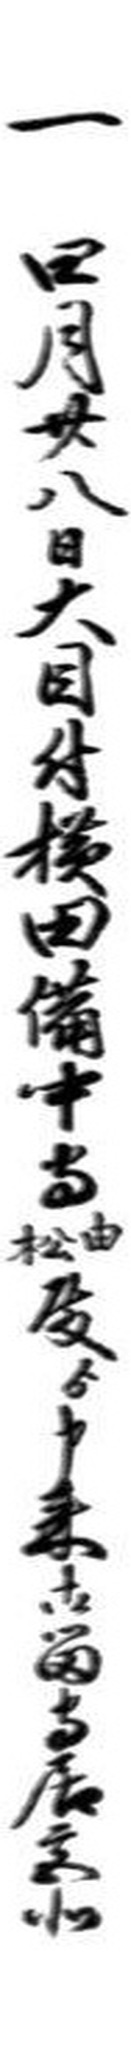一四月廿八日大目付横田備中守由松殿ゟ申来御留守居宮北
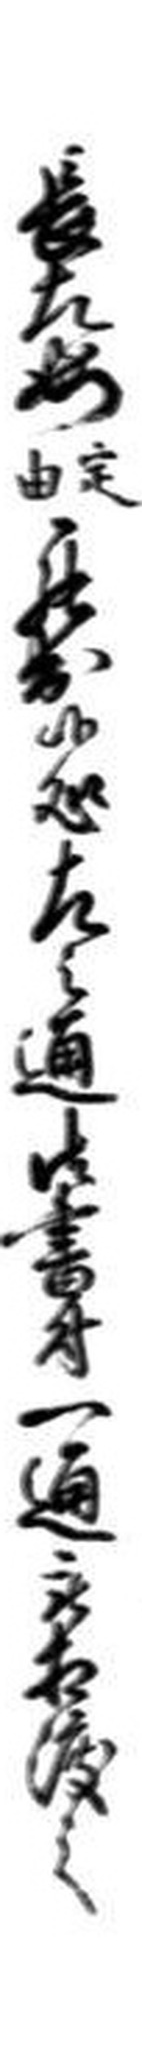長左衛門定由罷出候処左之通御書付一通被相渡之
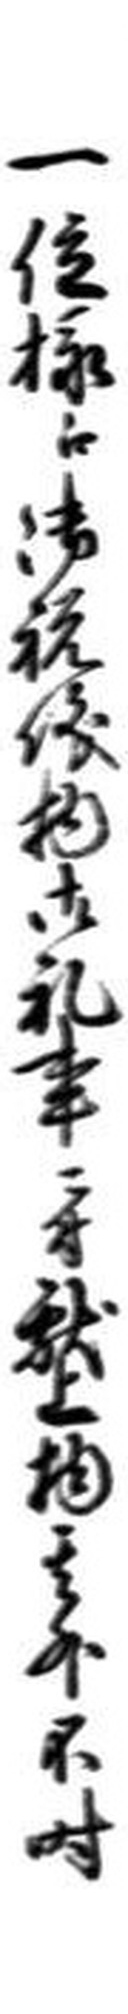一位様江御祝儀物御礼事ニ付献上物其外不時
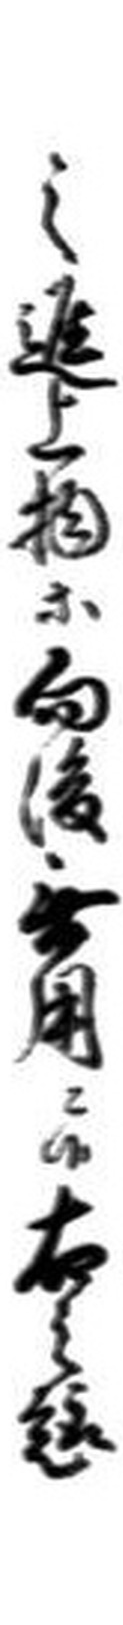之進上物等向後無用ニ候右之趣
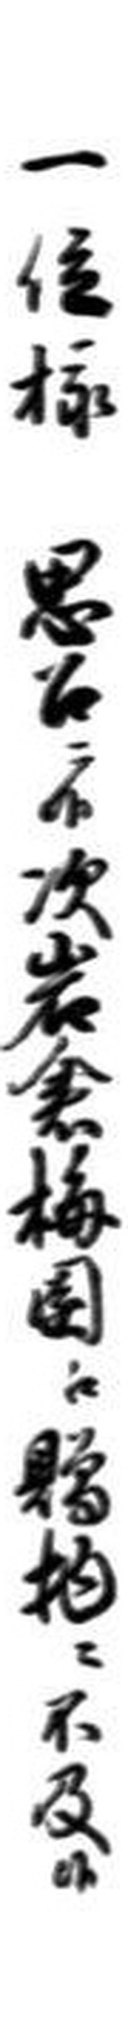一位様思召ニ候次岩倉梅園江贈物ニ不及候
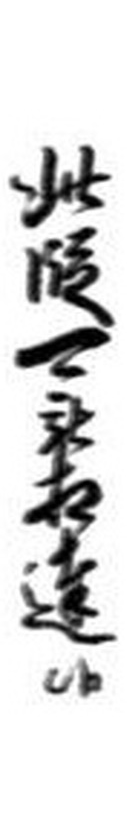此段可被相達候
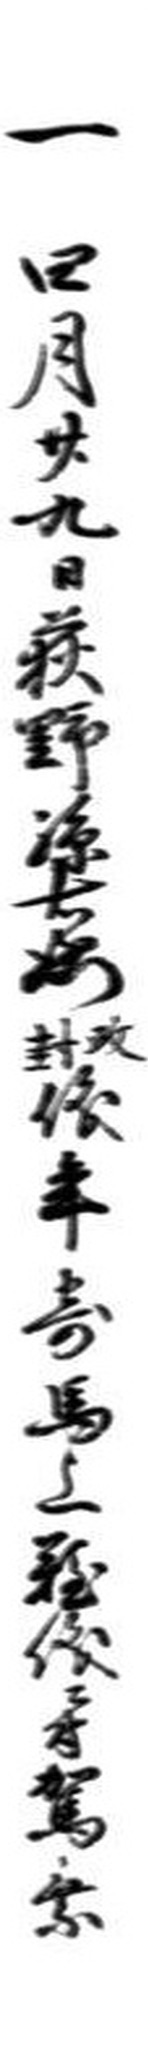一四月廿九日荻野孫右衛門政封儀年寄馬上難儀ニ付駕乗

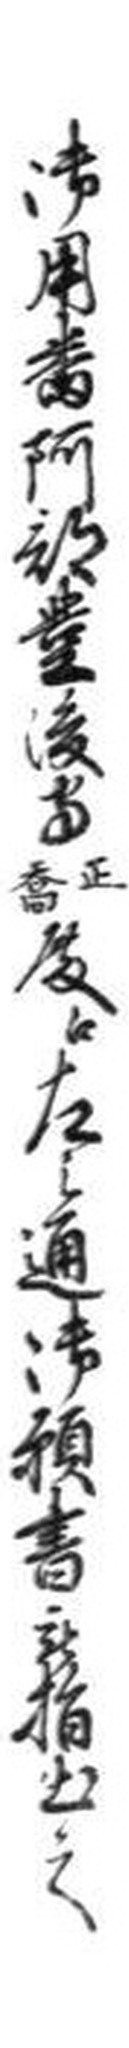御用番阿部豊後守正喬殿江左之通御願書被指出之
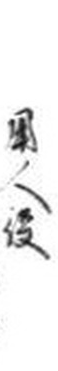用人役
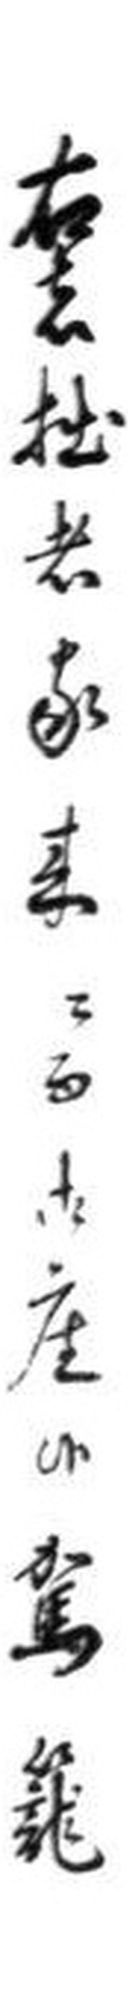右者拙者家来ニ而御座候駕籠
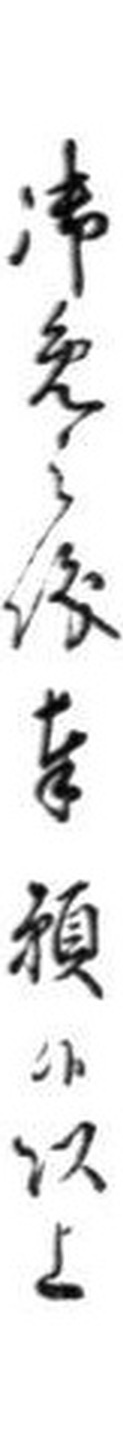御免之儀奉願候以上
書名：家譜 三十一 吉邦公 享保元年
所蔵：福井県文書館 Fukui Prefectural Archives
